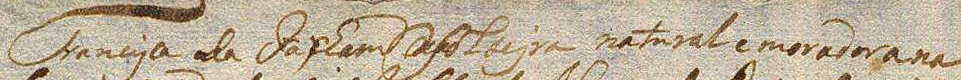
Francisca da Pacham soltejra natural e moradora na
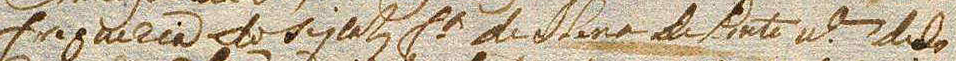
freguezia do sejcal, f.a de Ilena de Ponte u.a de Io
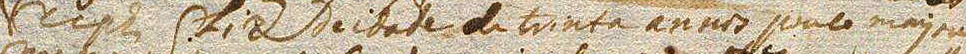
zeph o.Liv̄ de idade de trinta annos pouco majs ou
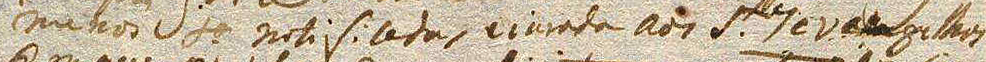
menos t.a notificada, e iurada aos s.tos evangelhos
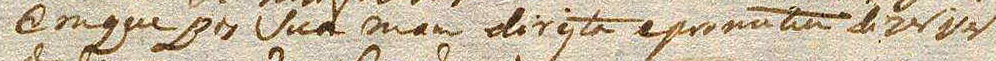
em que pos sua mam direjta e prometeu dizer ver
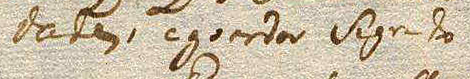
dade, e goardar Segredo
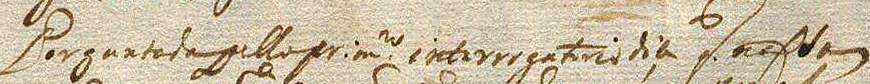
Perguntada pello prim.ro interrogatorio dice q̄. naõ sa
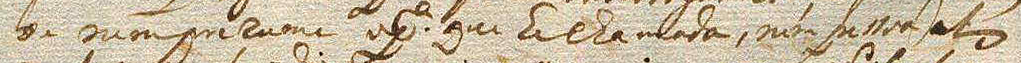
be nem prezume o p.a que he chamada, nem pessoa aL
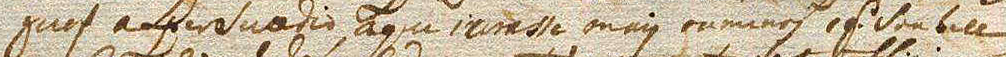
guaꝭ a persuadio, a que iurasse mais ou menos o q̄. soubece
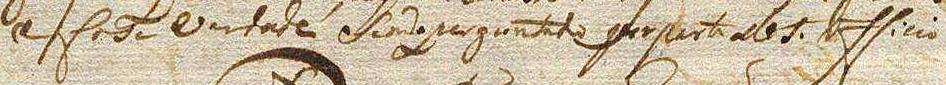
e fose verdade Sendo perguntado por parte do s. officio
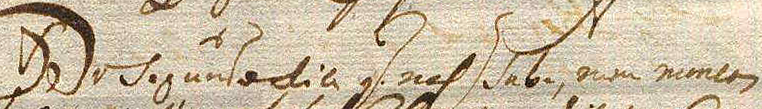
Do segundo dice q̄. naꝭ sabe, nem nunca
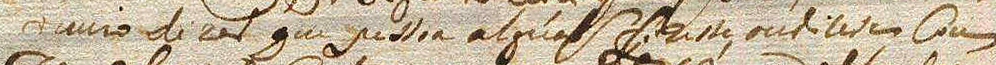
ouuio dizer que pessoa algūaꝭ fizesse, ou dicese Cou
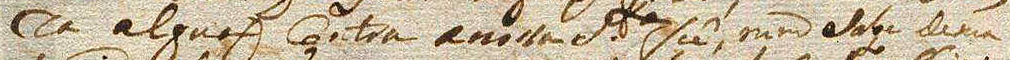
Za alguaꝭ Contra a nossa s.ta feé, nem sabe de ma
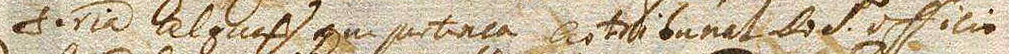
teria alguaꝭ que pertença ao tribunal do s.to officio
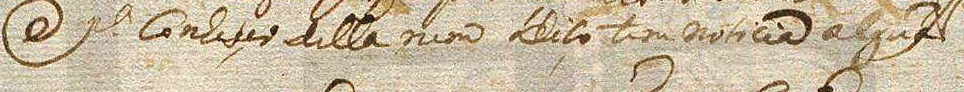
p.a Conheser della nem Diço tem noticia alguā
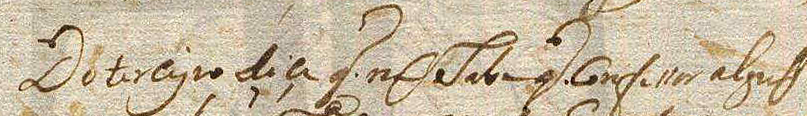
Do tercejro dice q̄. naꝭ Sabe q̄. Confessor alguꝭ
